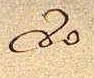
80
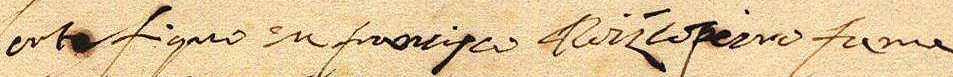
Certefiquo Eu francisco Roiz̄ copeiro fame
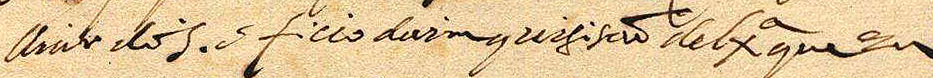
lliar do S. oficio da imquisisão de lxa que Eu
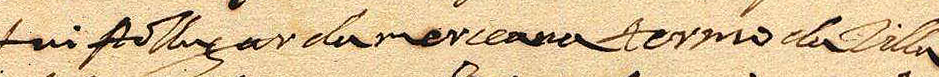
fui Ao llugar da merceana termo da Villa
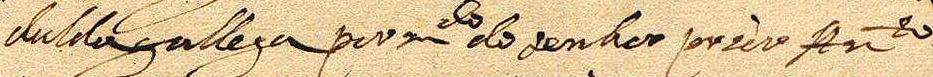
daldea gallega por mdo do senhor prior Anto
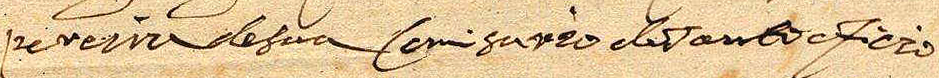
pereira de saa Comisario do santo oficio
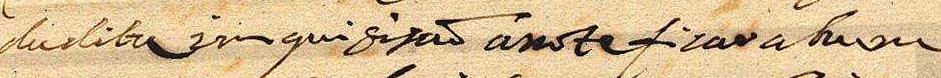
da dita imquisisão a noteficar a hum
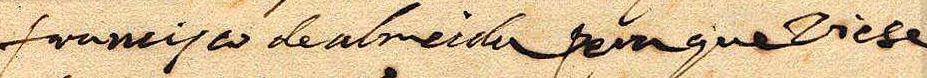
francisco de almeida pera que viese
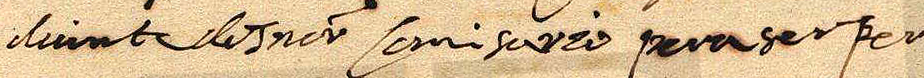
diante de snor̄ Comisario pera ser per
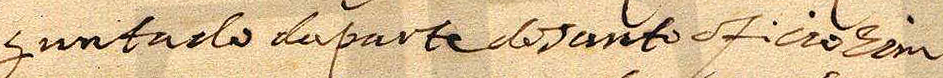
guntado da parte do santo oficio E im
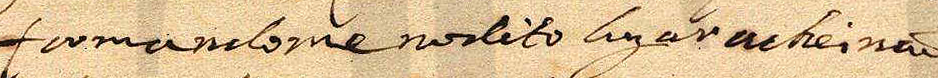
formandome no dito lugar achei naõ
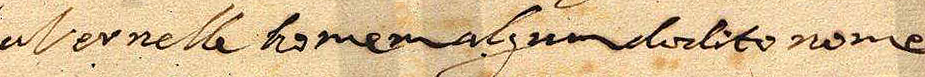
aver nelle homem algum do dito nome
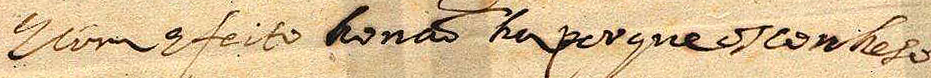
E com Efeito ho não ha porque os conheso
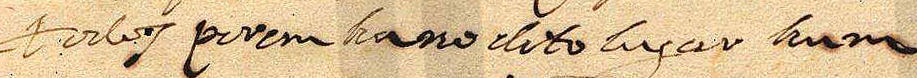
todos porem ha no dito lugar hum
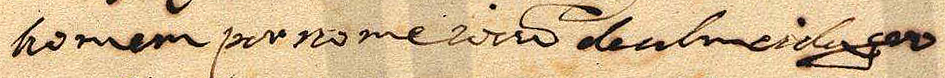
homem por nome ioaõ de almeida gro
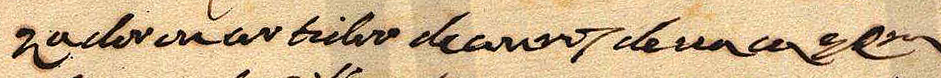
zador ou cortidor de couros de uaca E em
